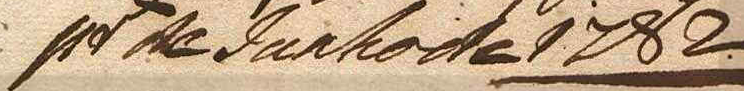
pro de Iunho de i782.
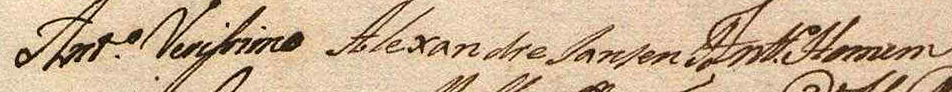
Ant.o Verissimo Alexandre Iansen Ant.o Homem
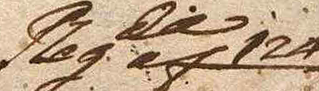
Reg.da a f i24
